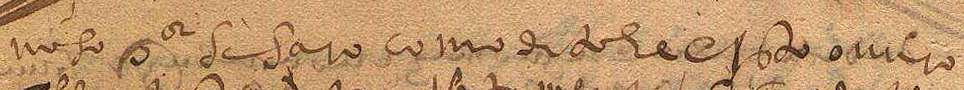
noso sor se saio como dito he e Jsto ouuio
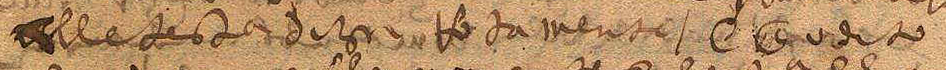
elle testa dizer Rotamente / E q̄ o dito
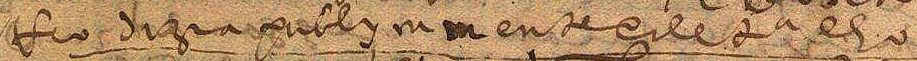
Reo dizia publycamente e elle ta lho
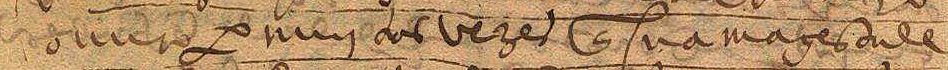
ouuio ꝑ mujtas vezes q̄ sua magestade
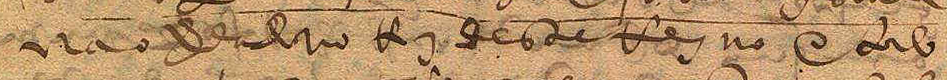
era o ꝟdadeiro Rey deste Reyno e todo
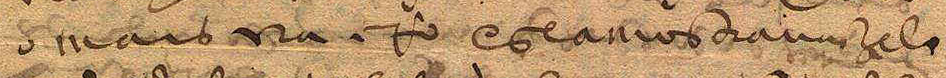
o mais era eRo e se amostraua zelo
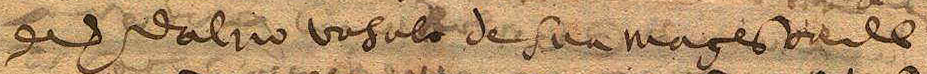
de ꝟdadeiro vasalo de sua magestade
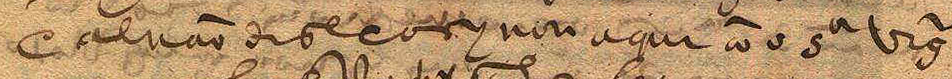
e al não dise asynou aqui cō o sor vigro
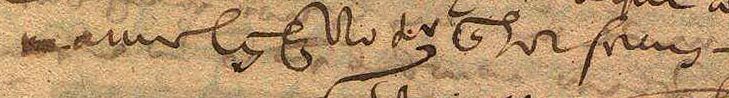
manuel glz̄ Noto q̄ ho escreuj
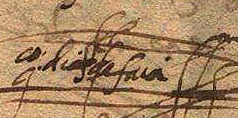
gço dias da faia
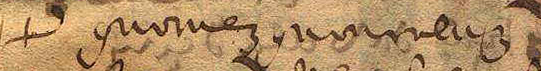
item guomez guonçaluz̄
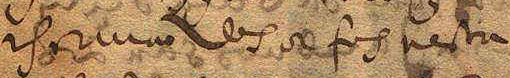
escriuaõ dos orfos nesta
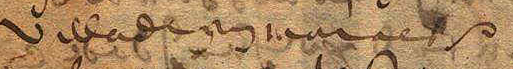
villa de gujmaraes e
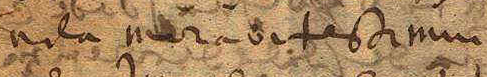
nela morador testemu
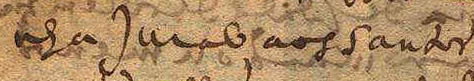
nha Jurado aos santos
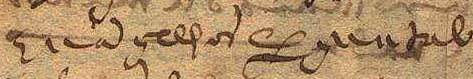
Euāgelhos e ꝑguntado
